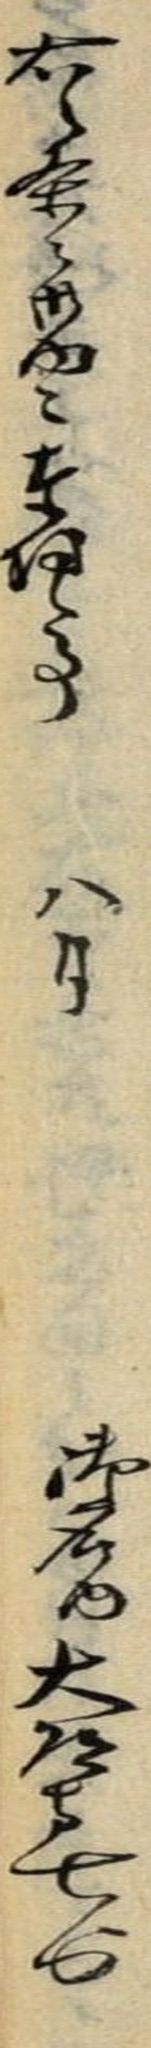右之条々御内々奉伺候事八月御名内大道寺七右衛門
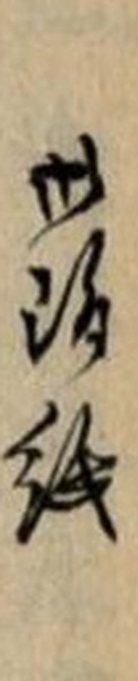御附紙
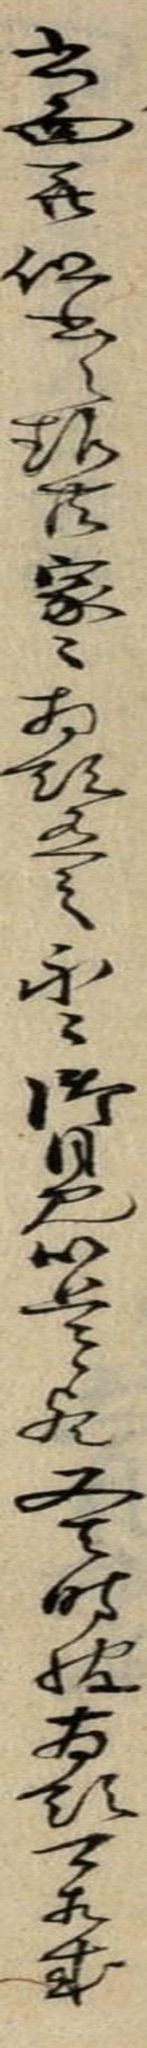書面并但書之趣共家々拝領有之永々御目見以上に候歟又は時服拝領可被相成
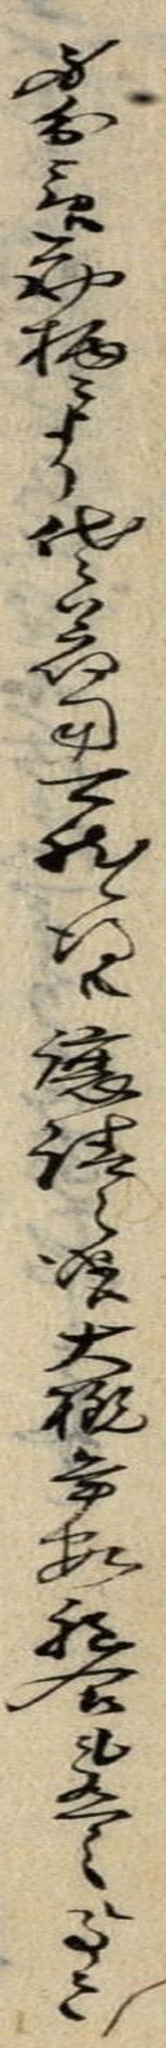身分に而は勤柄により代々着用可然候得共譲請之儀は大概年数程合も有之候事に候
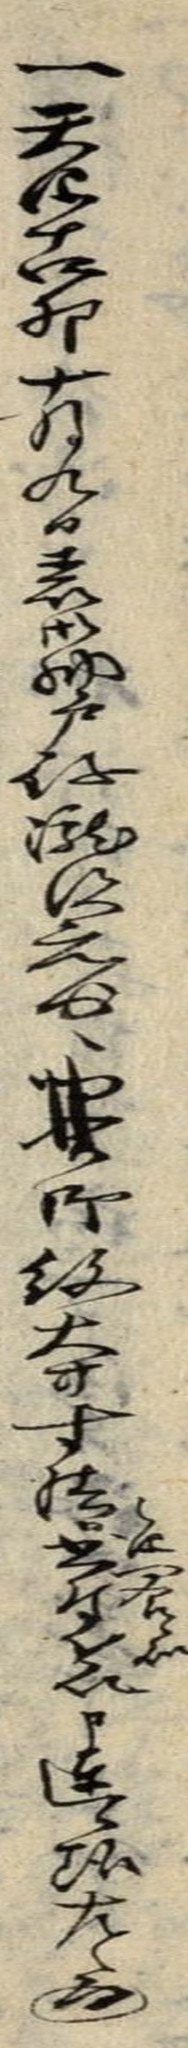一天明十四卯十月九日表御納戸役瀧沢元右衛門へ御紋大さ寸法之儀問合候処書付を以申達候趣左之通
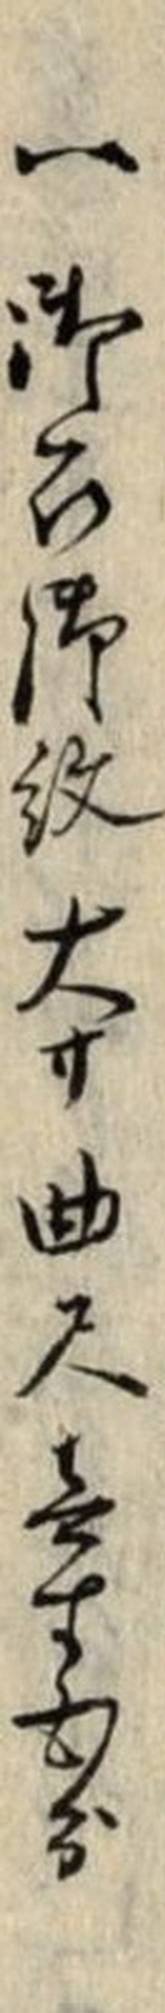一御召御紋大さ曲尺壱寸五分
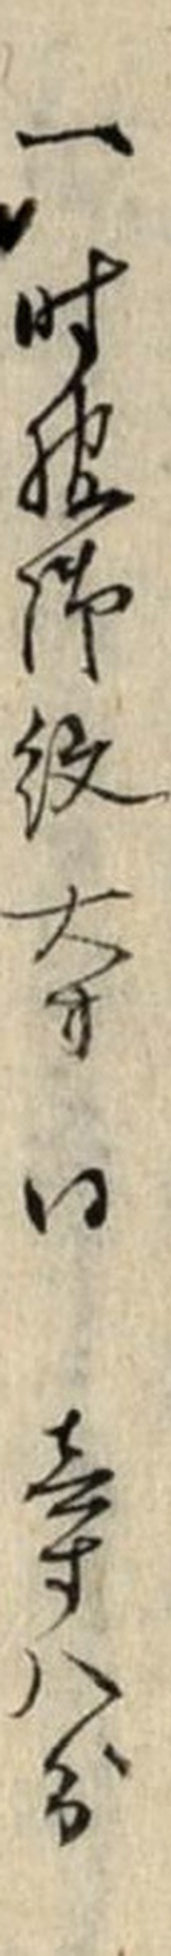一時服御紋大さ同壱寸八分
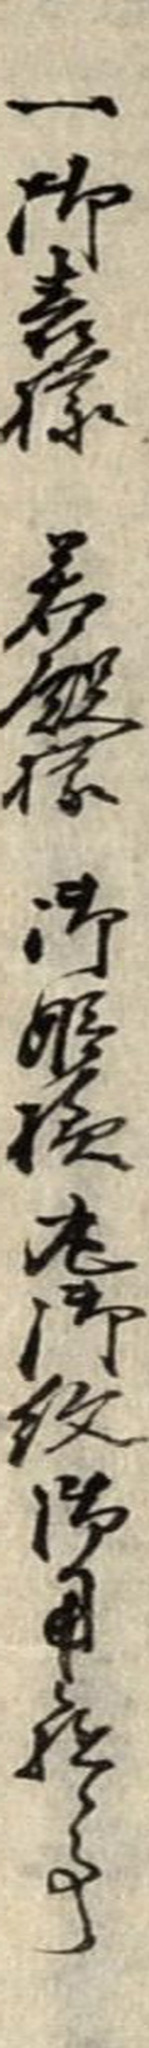一御表様若殿様御姫様丸御紋御用被遊候事
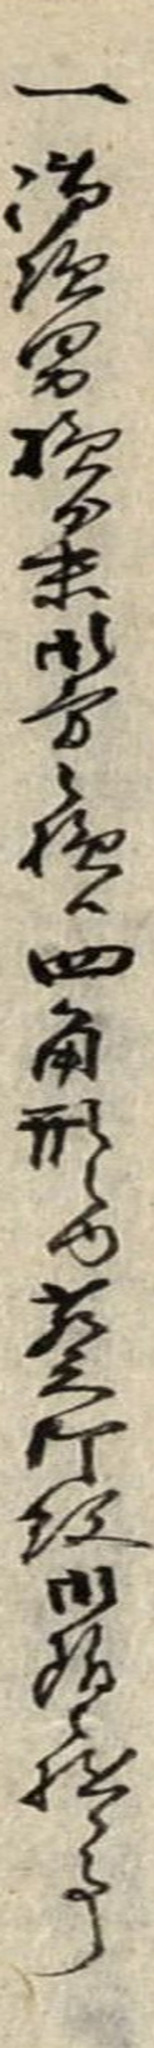一御次男様ゟ末御方々様は四角形之内葵御紋御附被遊候事
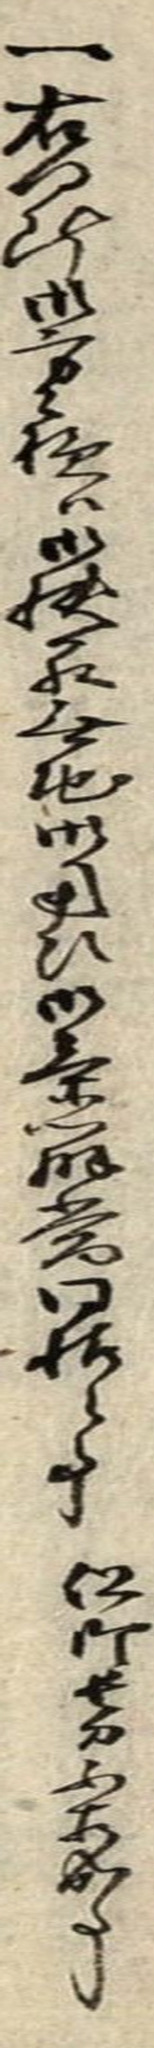一右同断御方々様は御挟箱無地御用ひ御茶弁当同様之事但御長刀不相成事
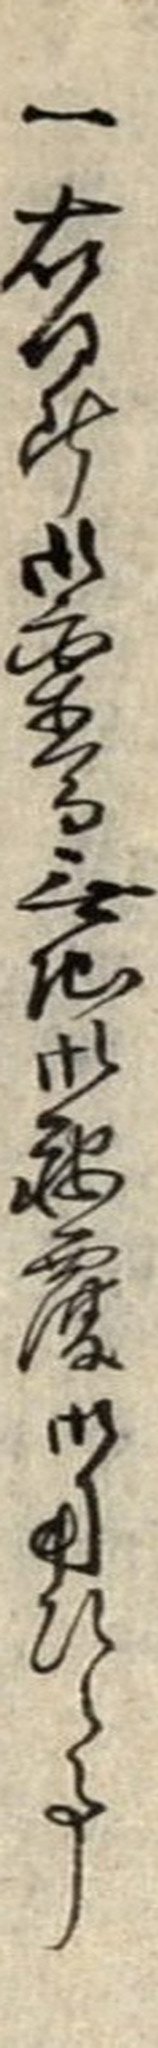一右同断御乗馬無地御鞍覆御用ひ候事
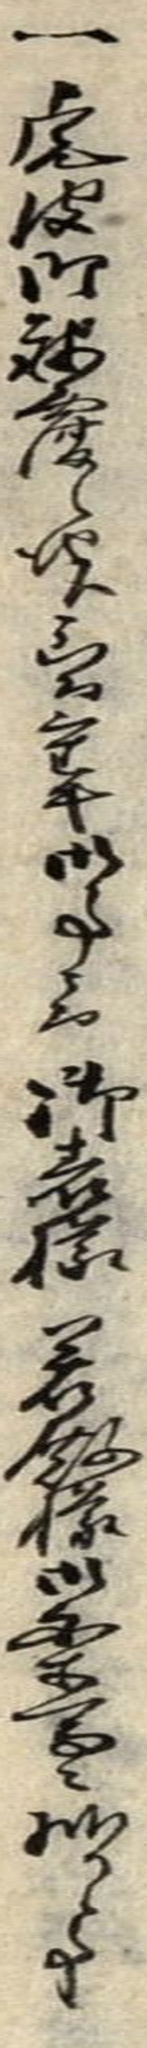一虎皮御鞍之儀は至而重き御事に而御表様若殿様御乗馬に掛り候事
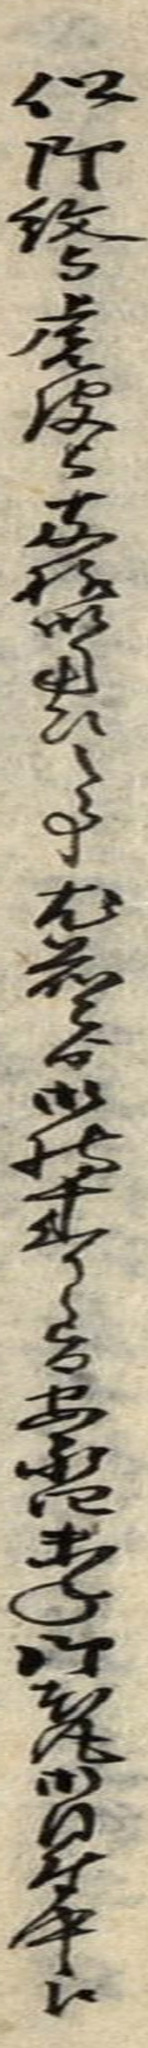但御紋と虎皮と両様御用ひ候事尤前々ゟ御持来り候旨安永四未年御本丸御目付中江
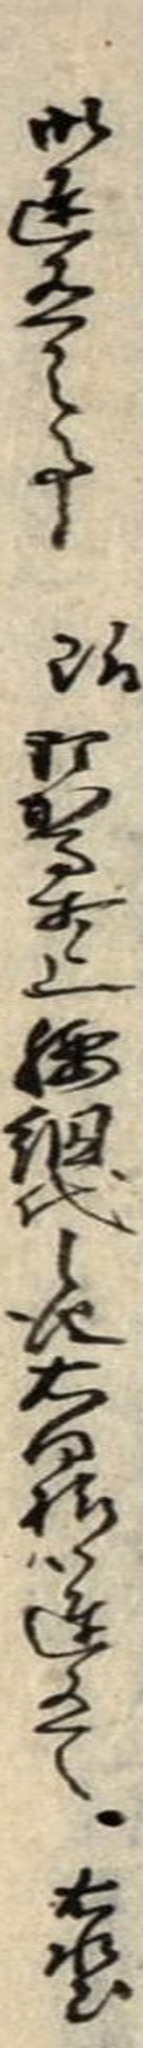御達有之候事附御駕打上腰網代之儀右同様御達有之

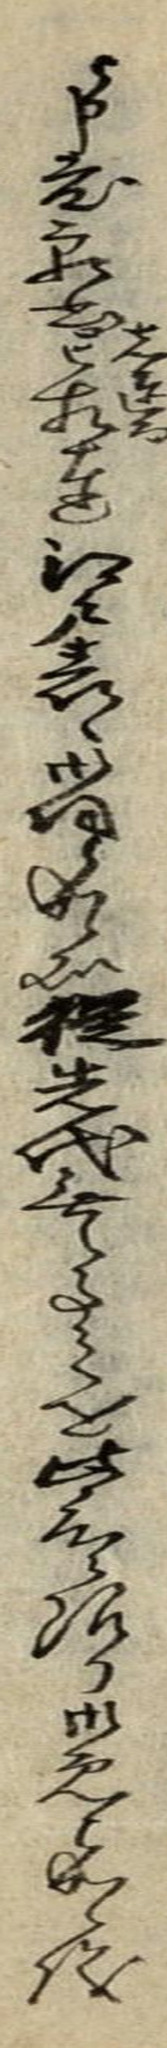被申度願書先達而被相達江戸表へ御伺被成候処従先代無之事を此度に限り御免成候儀
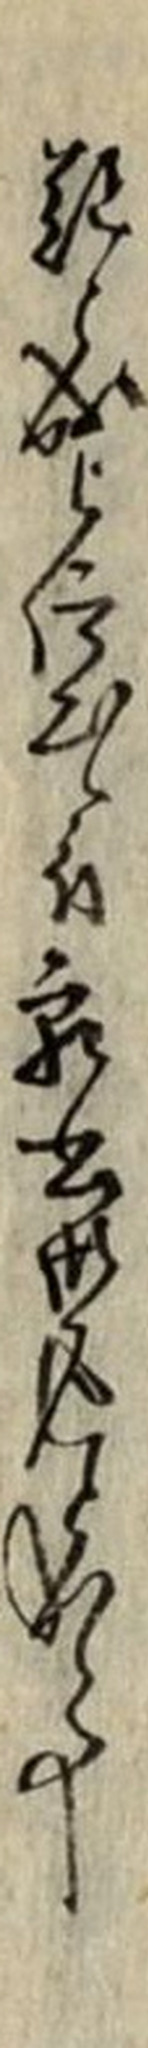難成被仰出候付願書御返被成候事
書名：蒐輯之部
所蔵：福井県文書館 Fukui Prefectural Archives
